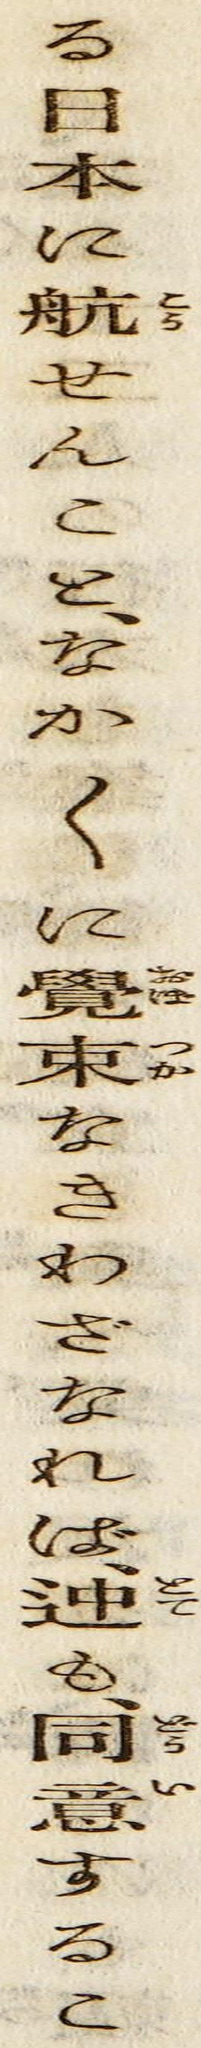る日本に航せんこと、なか〳〵に覚束なきわざなれば、迚も、同意するこ
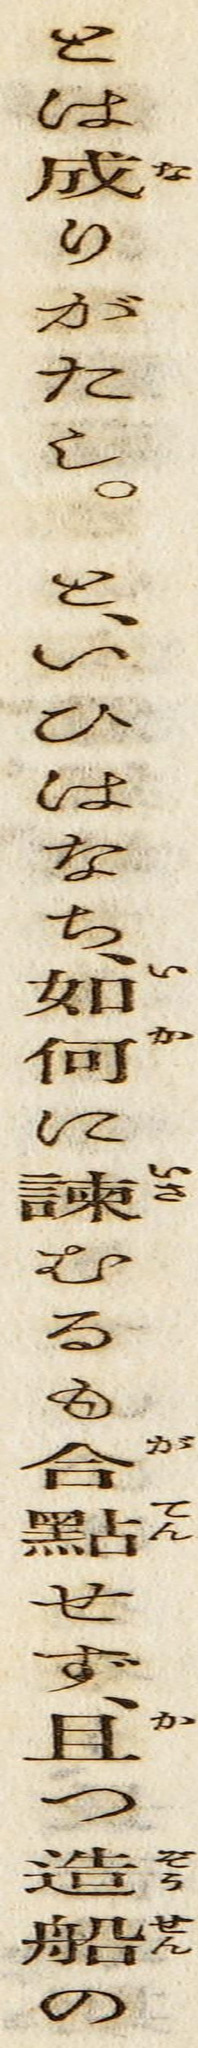とは成りがたし。と、いひはなち、如何に諫むるも合点せず、且つ造船の
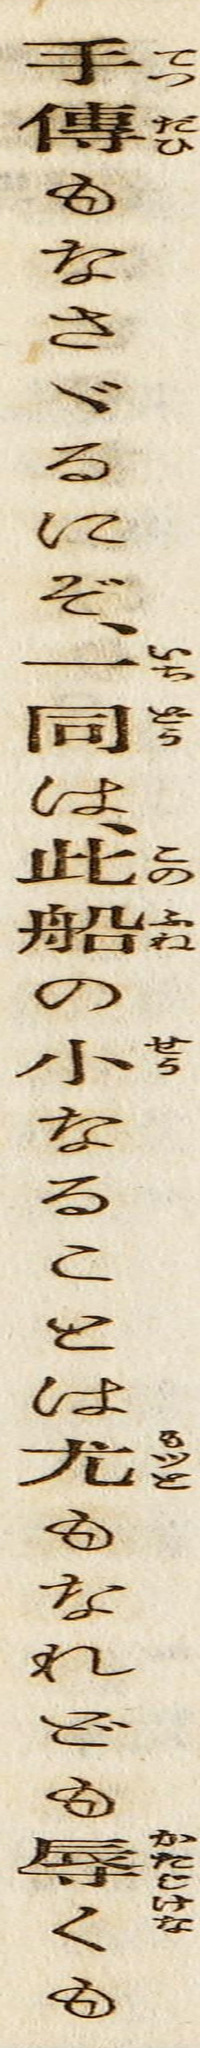手伝もなさヾるにぞ、一同は、此船の小なることは尤もなれども辱くも
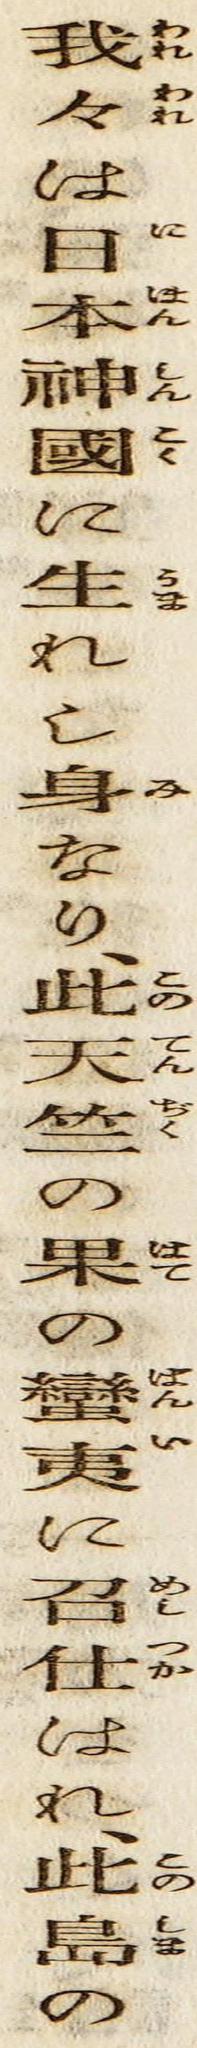我々は日本神国に生れし身なり、此天竺の果の蛮夷に召仕はれ、此島の
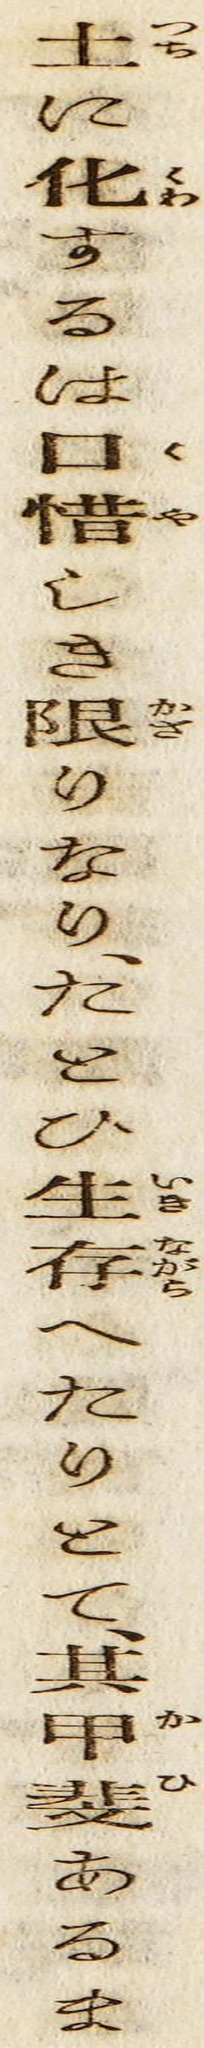土に化するは口惜しき限りなり、たとひ生存へたりとて、其甲斐あるま
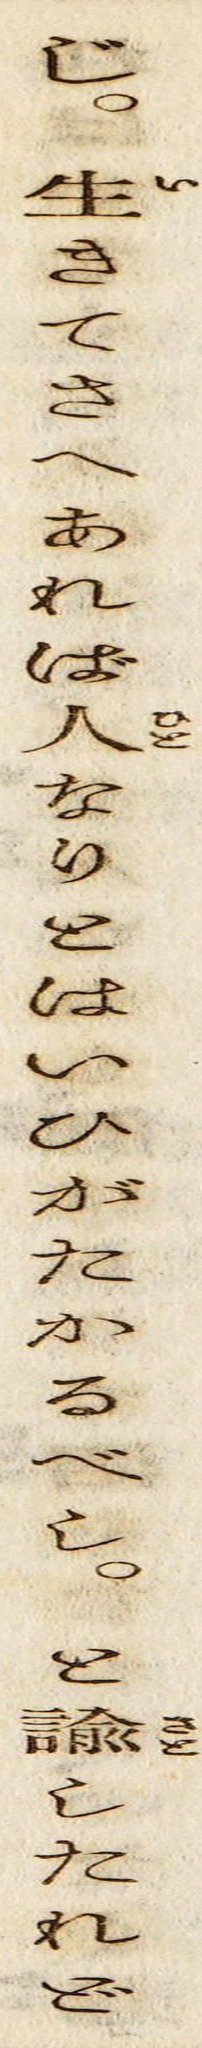じ。生きてさへあれば人なりとはいひがたかるべし。と諭したれど
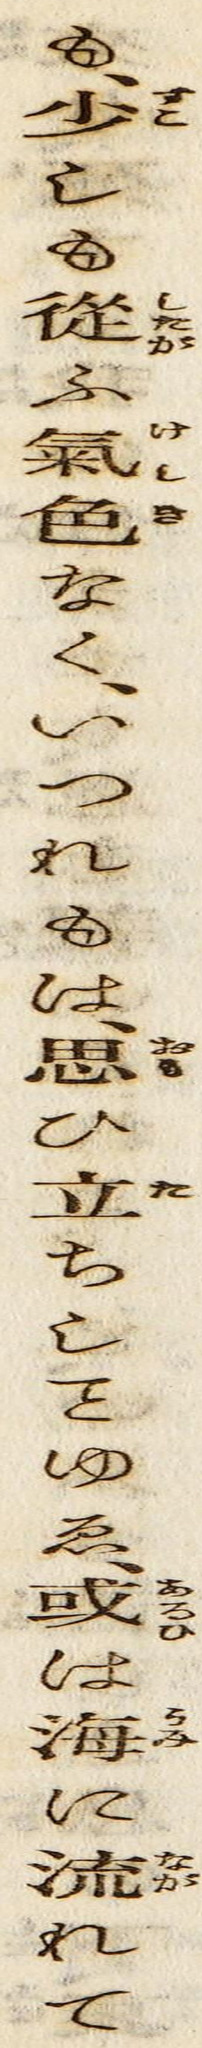も、少しも従ふ気色なく、いつれもは、思ひ立ちしことゆゑ、或は海に流れて
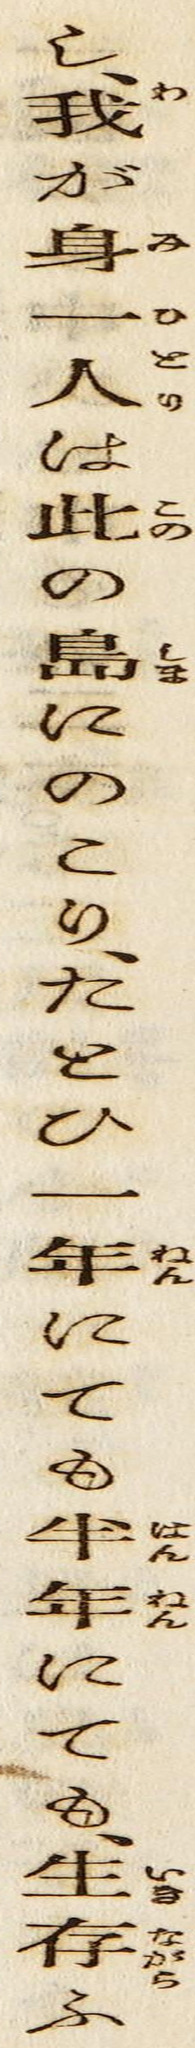し、我が身一人は此の島にのこり、たとひ一年にても半年にても、生存ふ
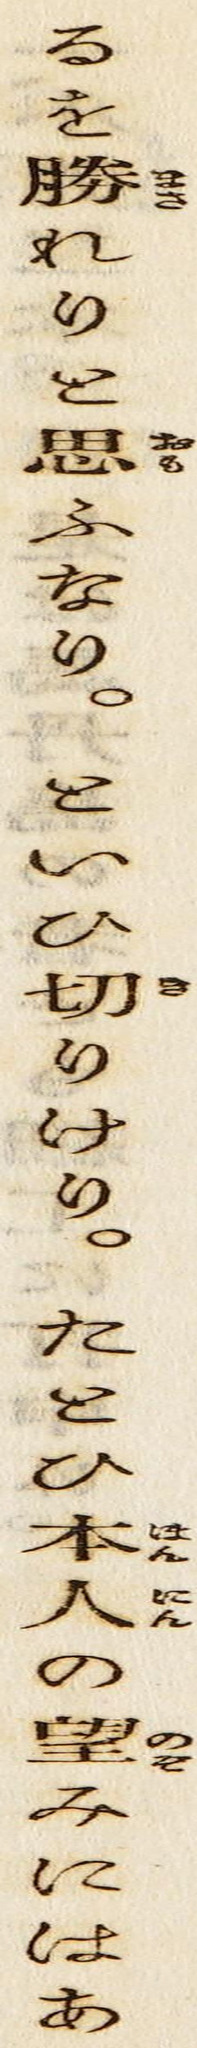るを勝れりと思ふなり。といひ切りけり。たとひ本人の望みにはあ
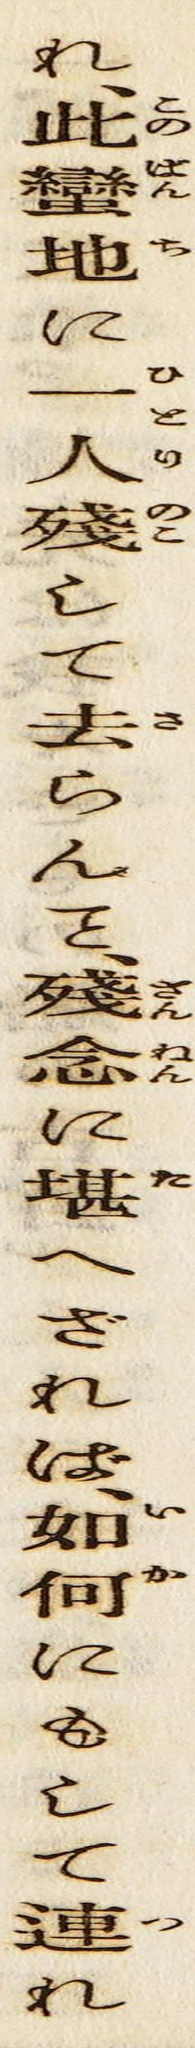れ、此蛮地に一人残して去らんこと、残念に堪へざれば、如何にもして連れ
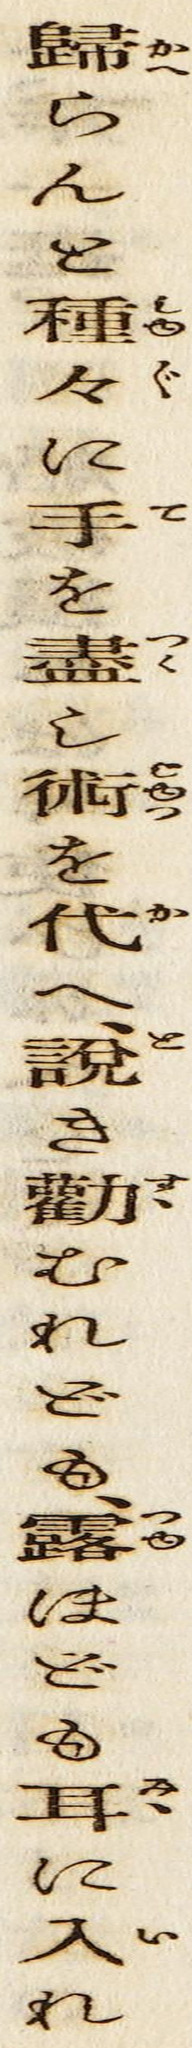帰らんと種々に手を尽し術を代へ、説き勧むれども、露ほども耳に入れ
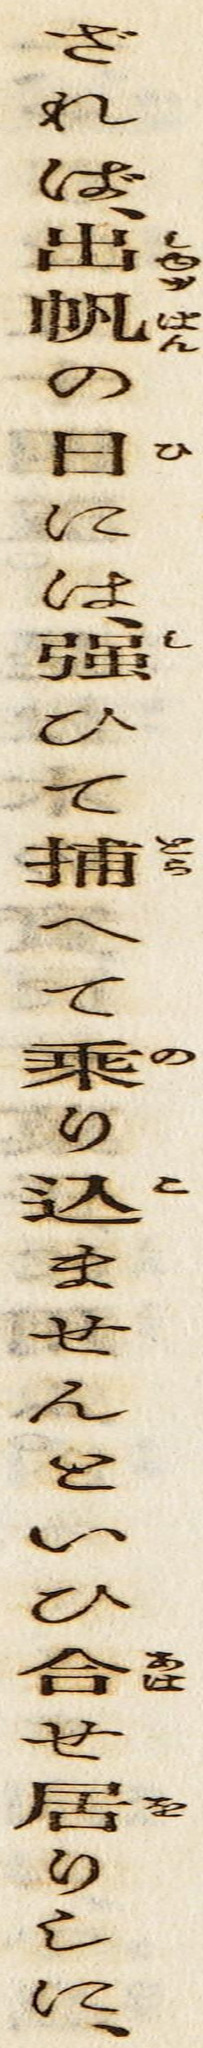ざれば、出帆の日には、強ひて捕へて乗り込ませんといひ合せ居りしに、
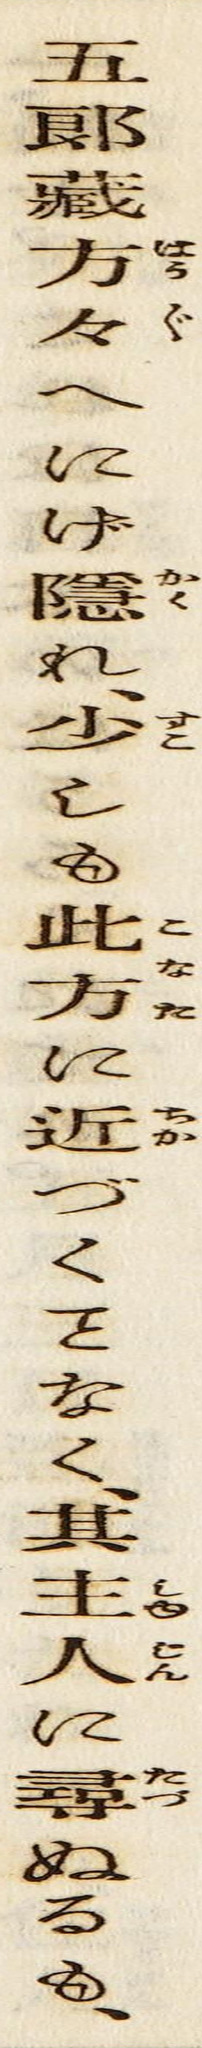五郎蔵方々へにげ隠れ、少しも此方に近づくことなく、其主人に尋ぬるも、
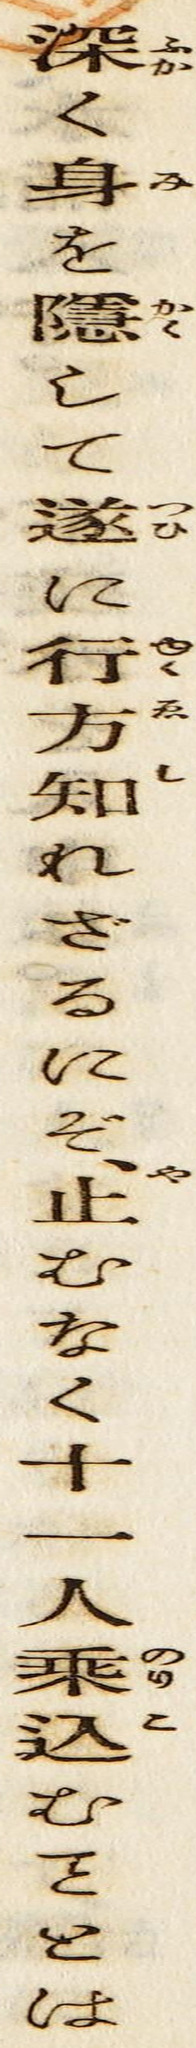深く身を隠して遂に行方知れざるにぞ、止むなく十一人乗込むこととは
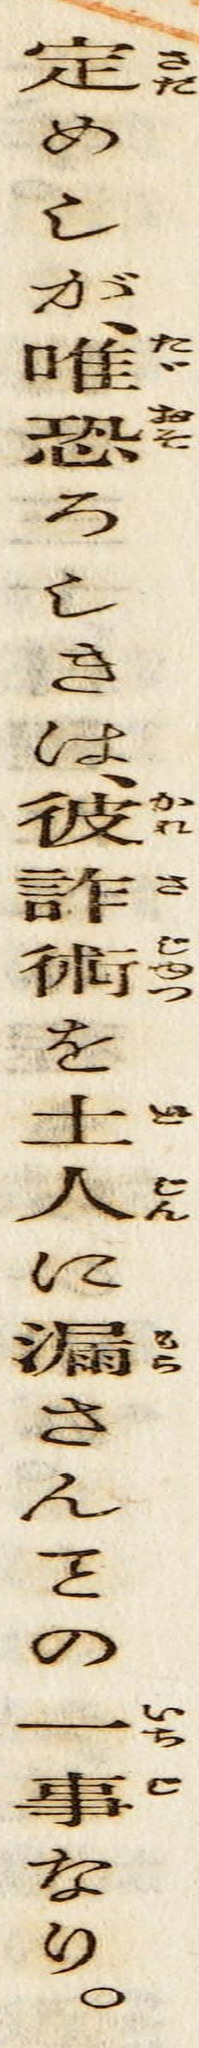定めしが、唯恐ろしきは、彼詐術を土人に漏さんことの一事なり。
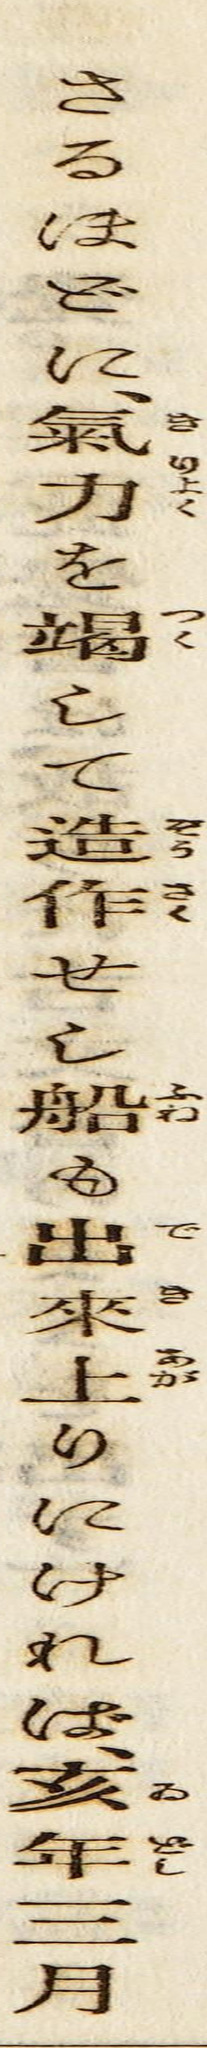さるほどに、気力を竭して造作せし船も出来上りにければ、亥年三月
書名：日本漂流譚
